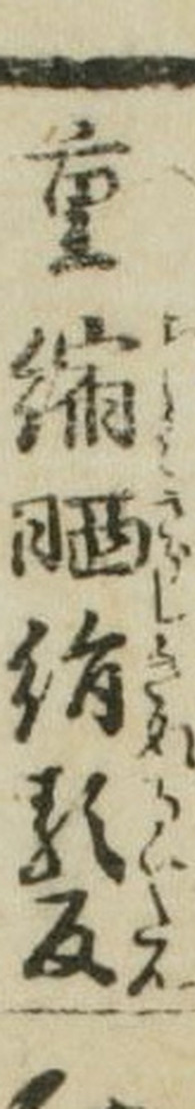重縮晒絹類反
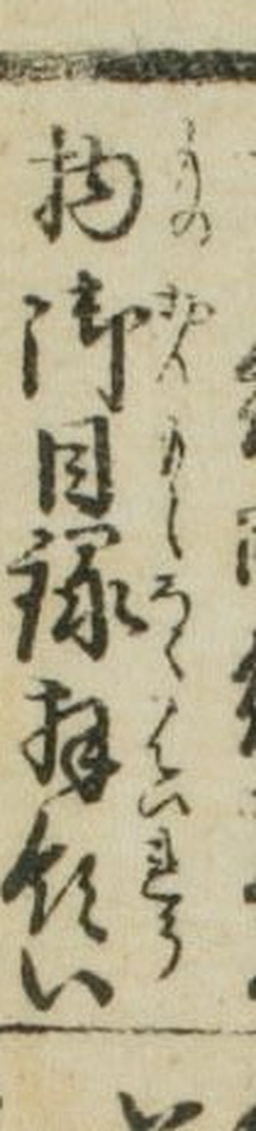物御目録拝領い
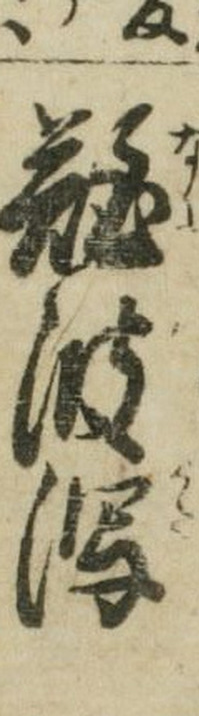難波潟
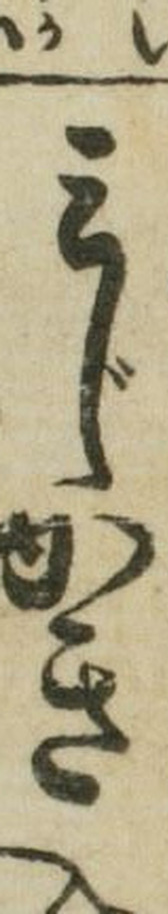みじかき
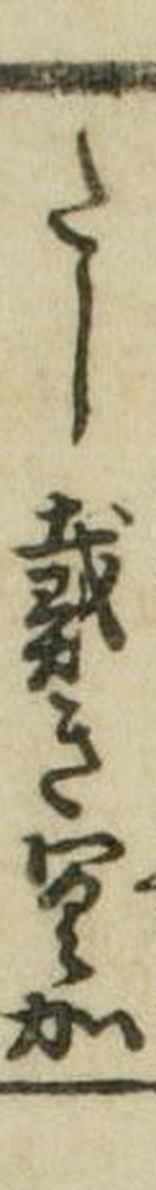たし戴き冥加
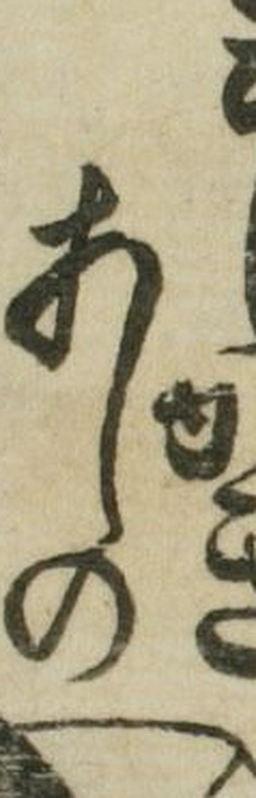あしの
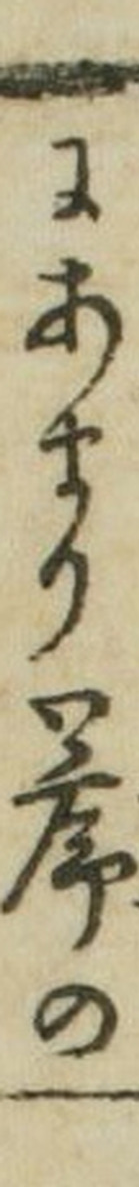にあまり御序の
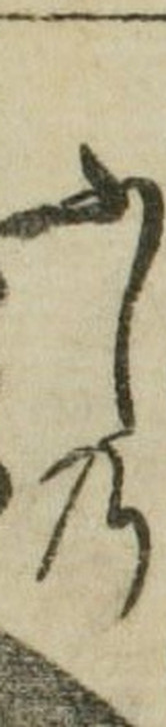ふしの
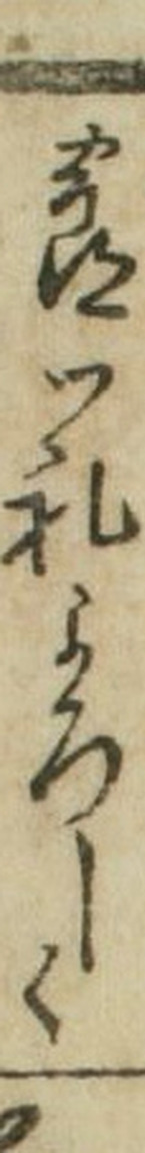節御礼よろしく
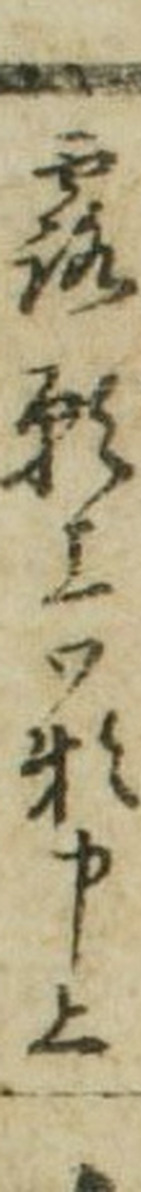露願上御頼申上
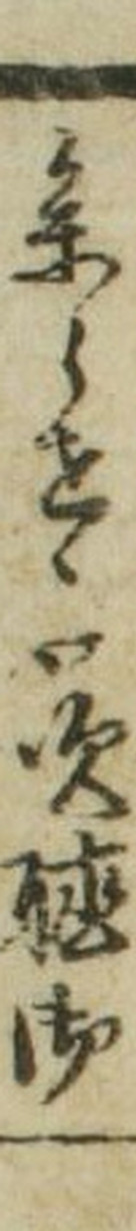参らせ候御吹聴御

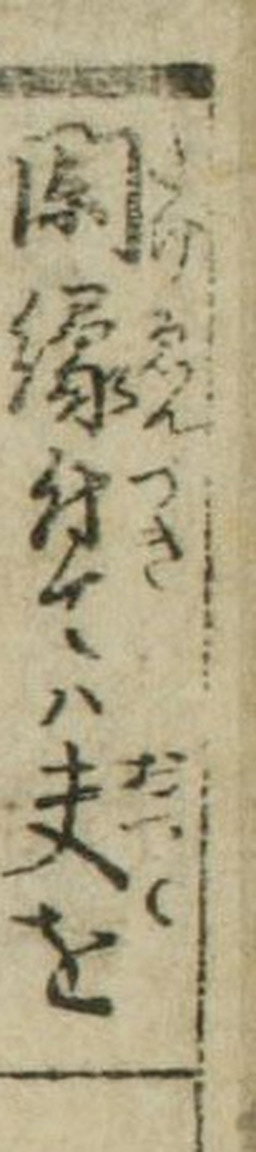闌縁付ては夫を
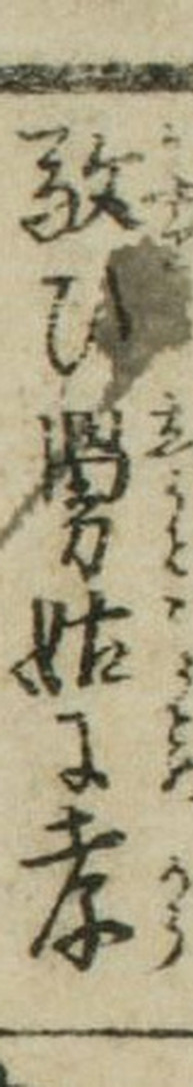敬ひ舅姑に孝
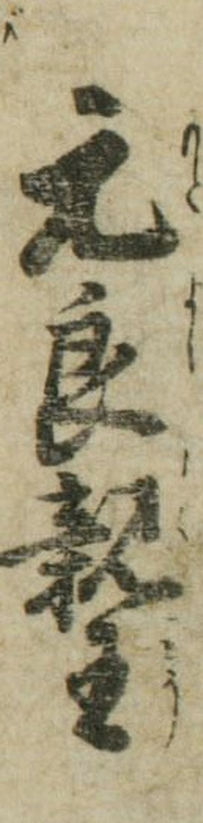元良親王
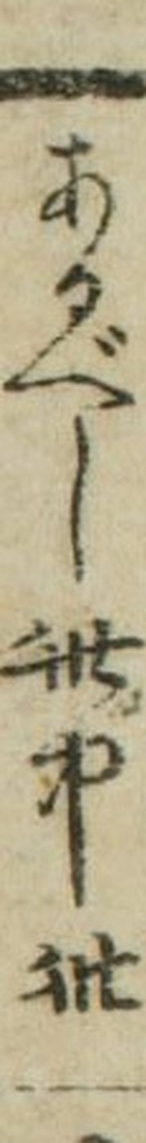あるべし此中此
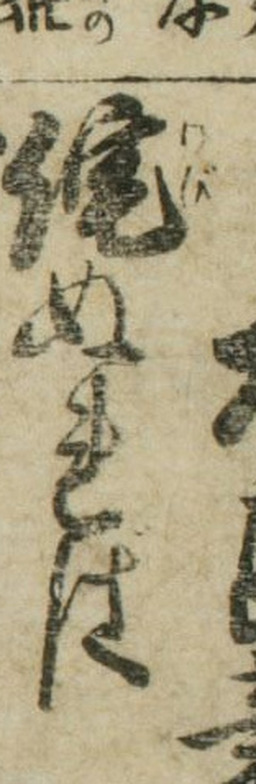侘ぬれば
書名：百人一首
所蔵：東京学芸大学教育コンテンツアーカイブ
